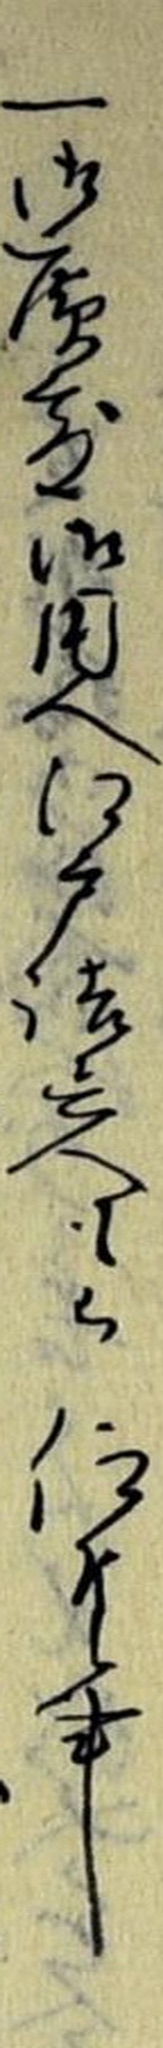一御広敷御用人江戸詰壱人ツヽ被仰付候事
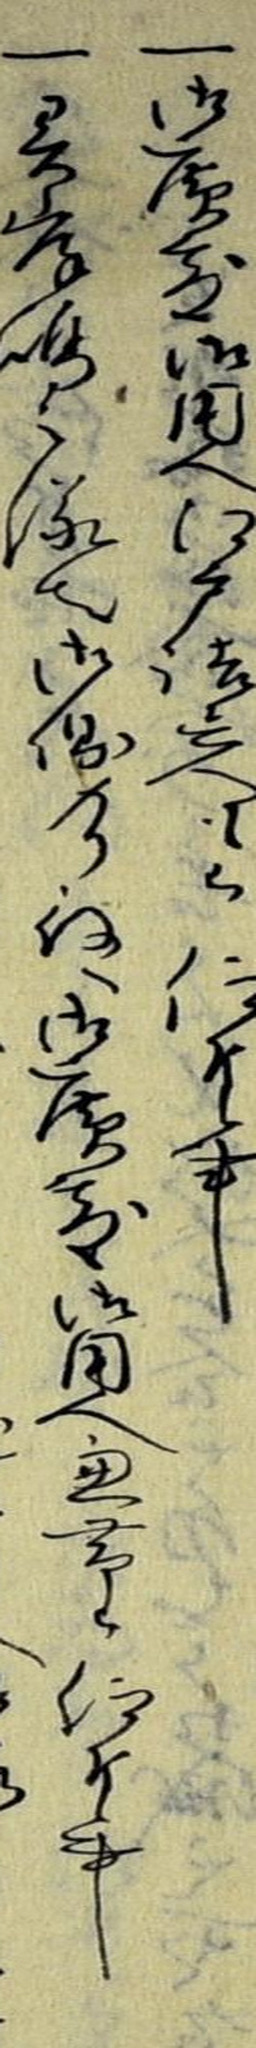一霊岸嶋之儀は御側〆り役へ御広敷御用人兼帯被仰付候事
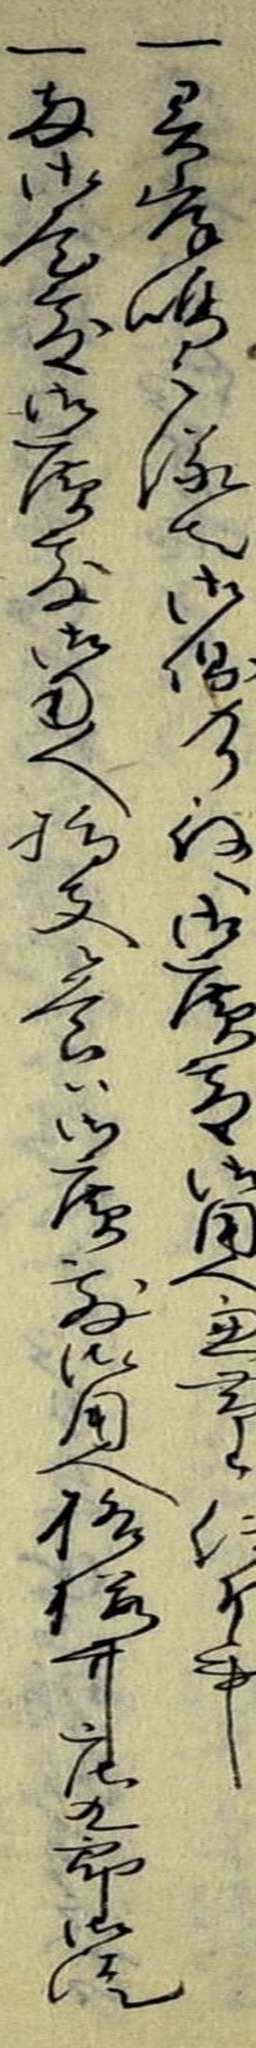一両御屋敷御広敷御用人指支之節は御広敷御用人格桜井庄九郎御徒
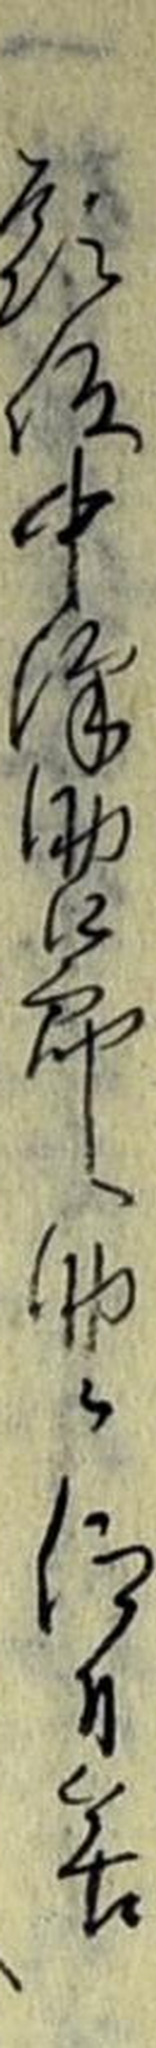頭仮中沢助四郎へ助被仰付筈
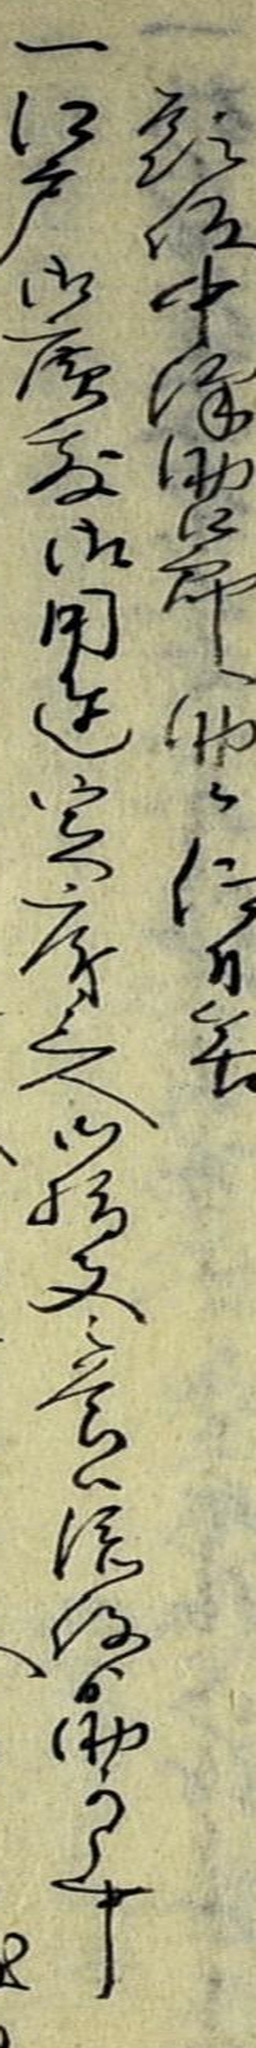一江戸御広敷御用達定府三人御指支之節は添役ゟ助可申事
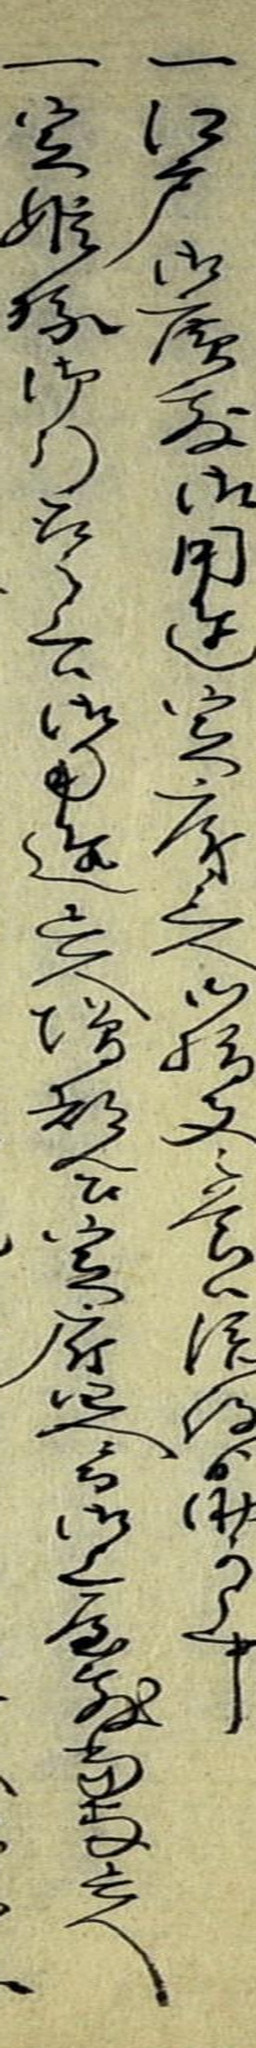一定姫様御引取之上は御用達壱人増都合定府四人に而御上屋敷当番壱人
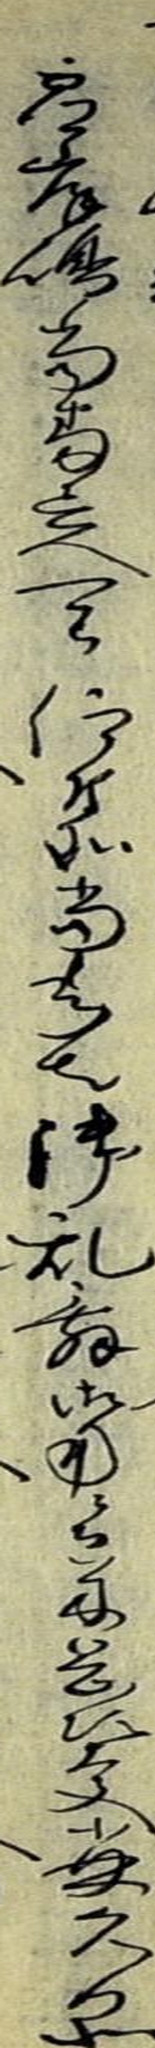霊岸嶋当番壱人可被仰付処当年は御乱舞御用に而米岡次太夫小林九兵衛
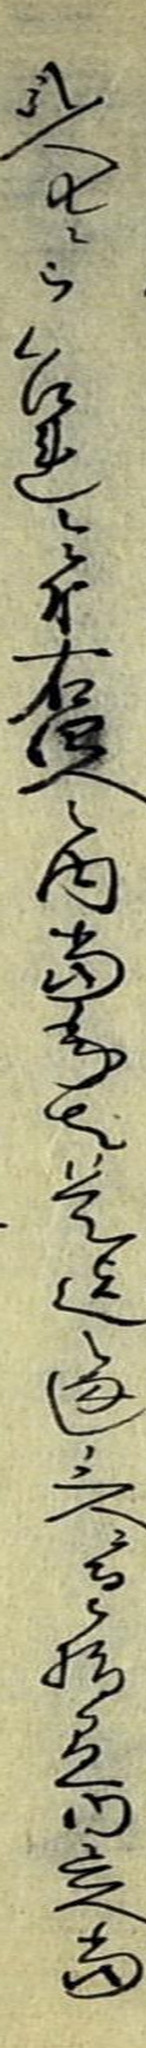弐人共に被召連候に付右四人之内当年は是迄之通三人に而被指置内壱人当
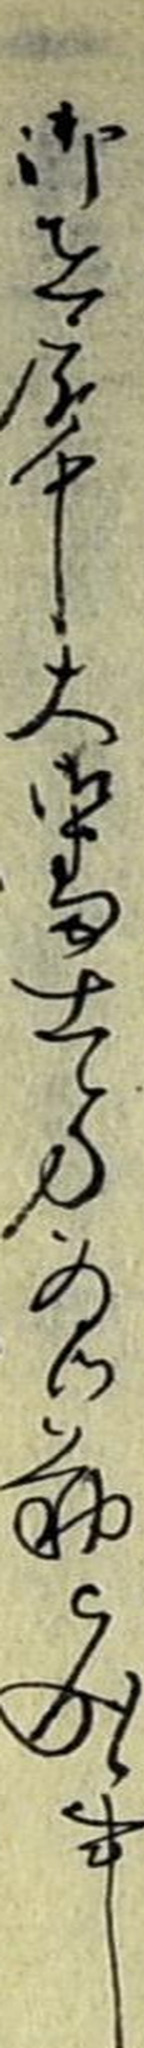御在府中大御番士方為御勤被成候事
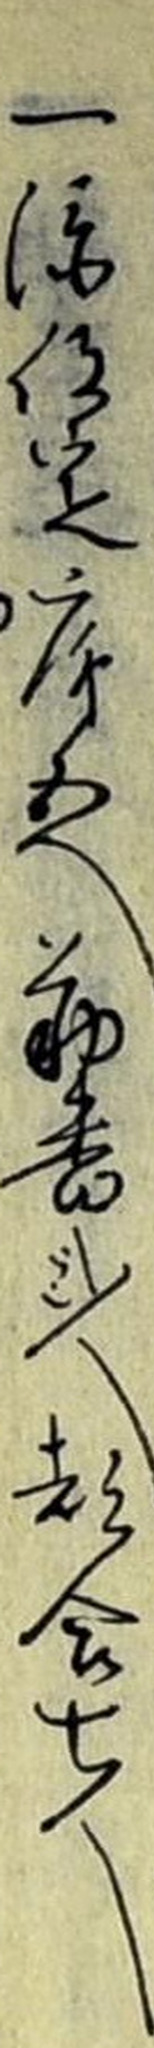一添役定府五人勤番弐人都合七人
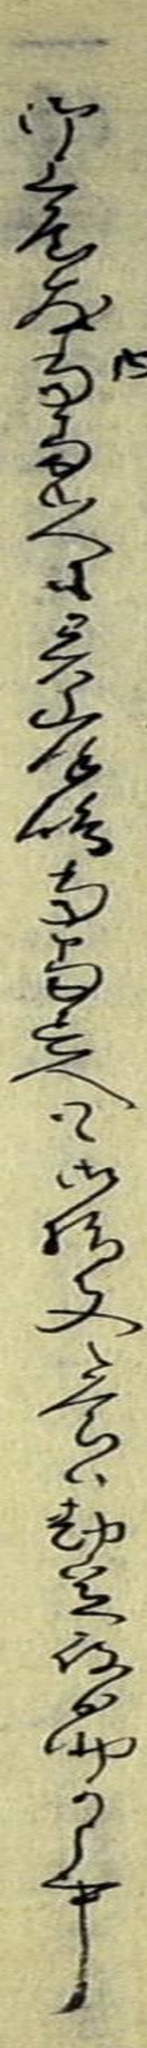御上屋敷当番弐人ツヽ霊岸嶋当番壱人ツヽ御指支之節は勘定役ゟ助可申事
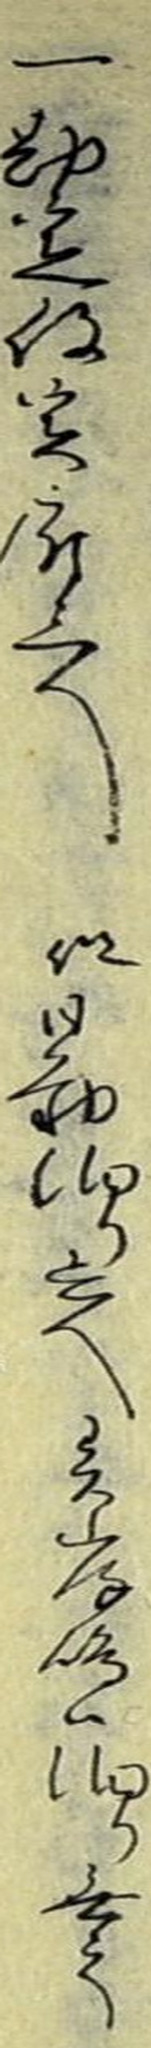一勘定役定府三人但日勤泊り壱人霊岸嶋は泊り無之
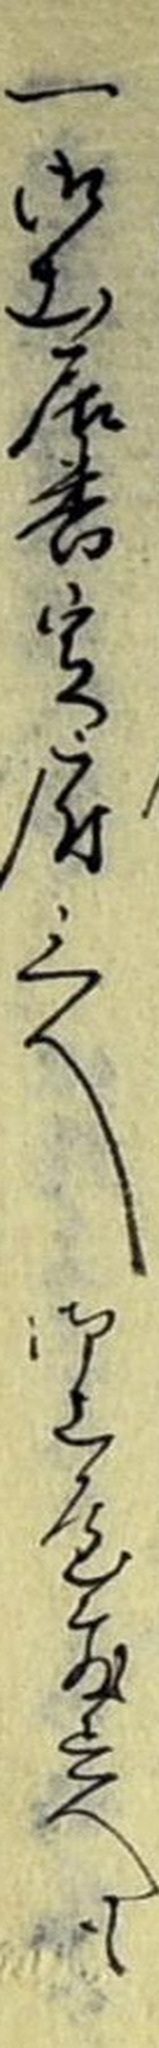一御出居番定府三人御上屋敷壱人ツヽ
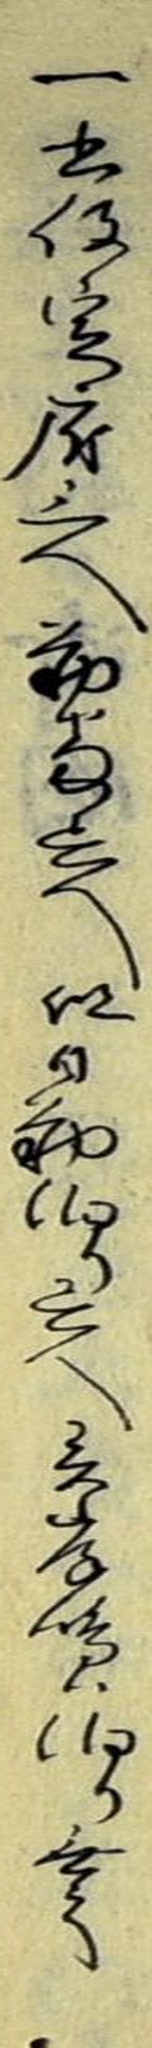一書役定府三人勤番壱人但日勤泊り壱人霊岸嶋は泊り無之

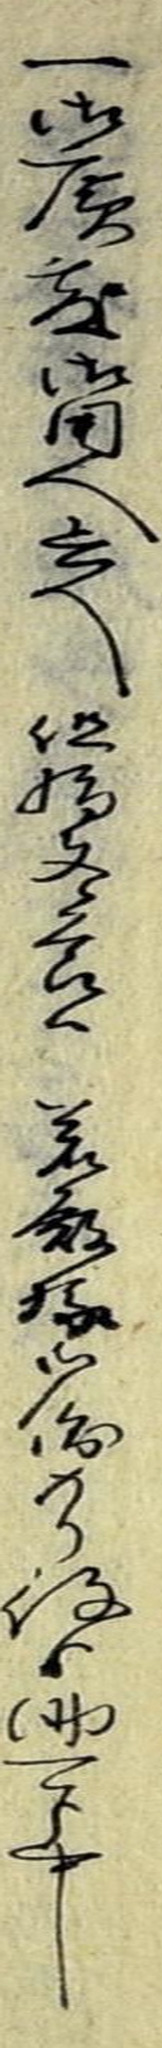一御広敷御用人壱人但指支候節は若殿様御側〆り役ゟ助可被申事
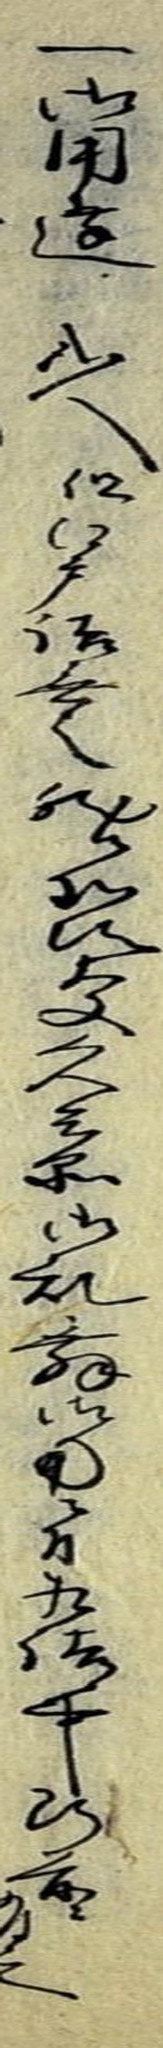一御用達弐人但江戸詰無之然る処次大夫久兵衛御乱舞御用に付相詰中断前に有之
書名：命令之部 二
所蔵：福井県文書館 Fukui Prefectural Archives
